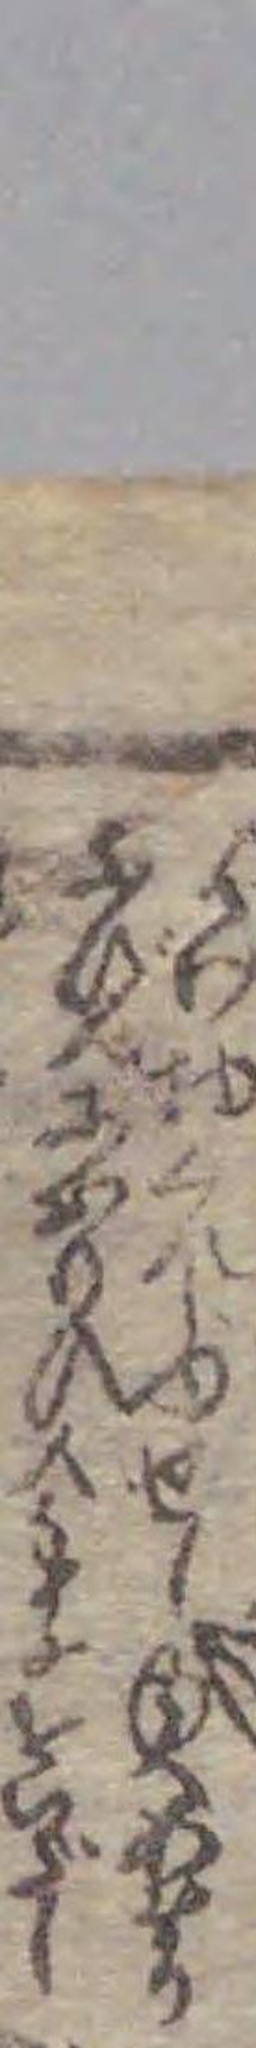ふびんにおもひ入金子をいだし
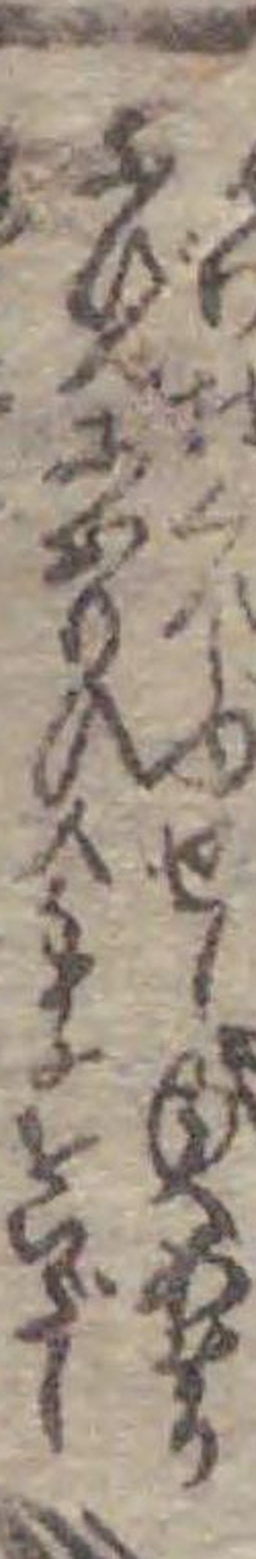ふびんにおもひ入金子をいだし
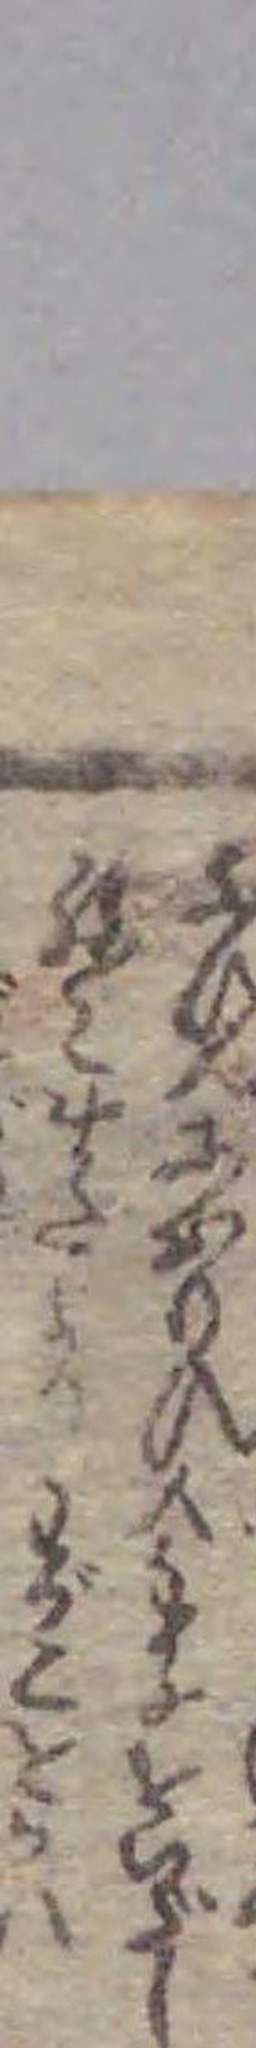ねこまたよりわがこをかい
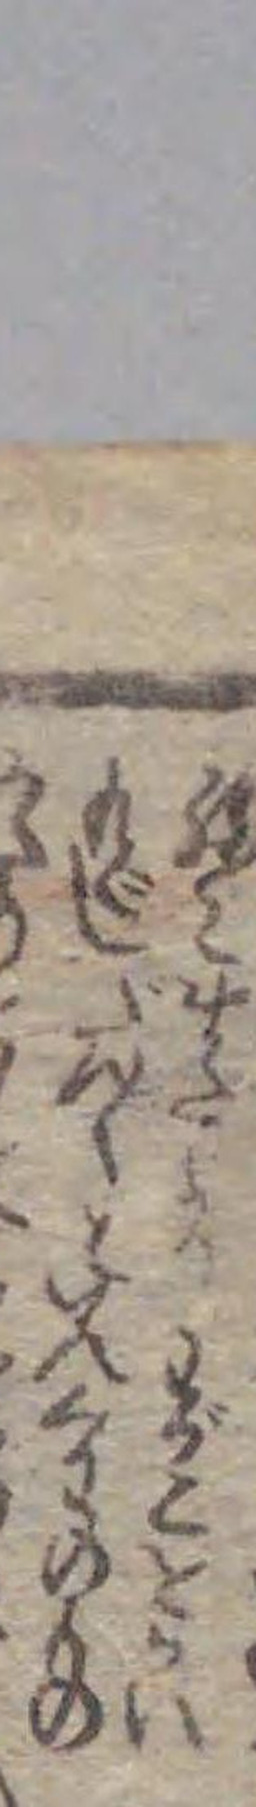もどしだん〳〵といんくわのもの
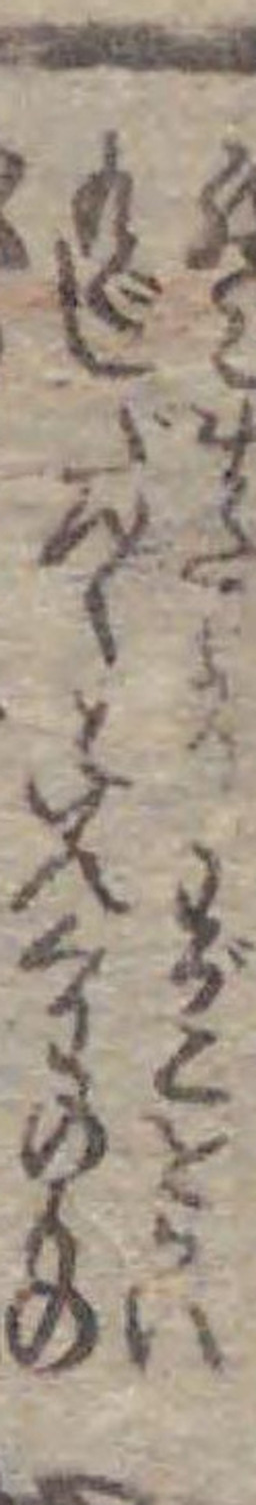もどしだん〳〵といんくわのもの
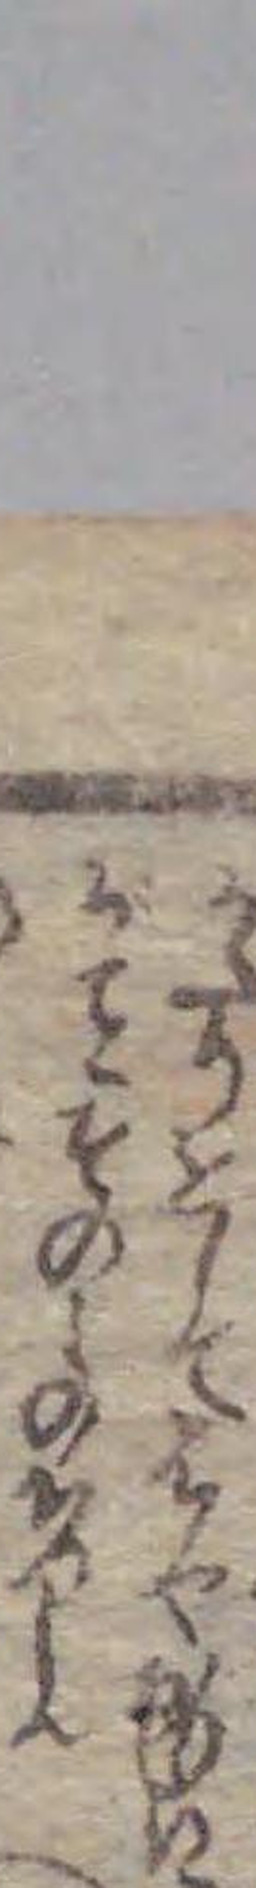がことそのみのほつしん
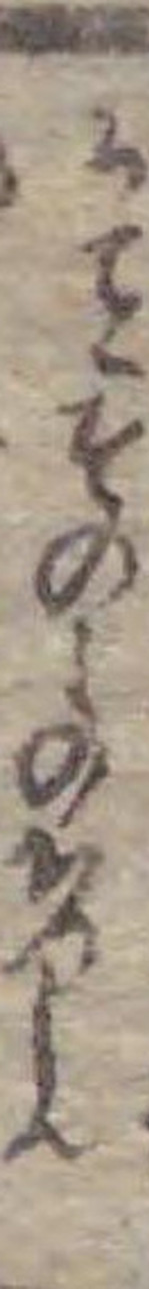がことそのみのほつしん
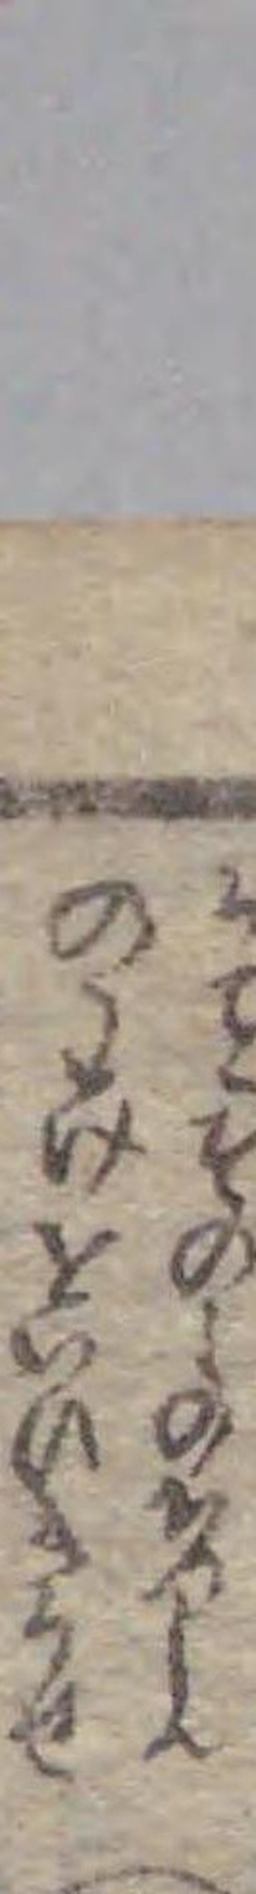のわけをいひきかせ
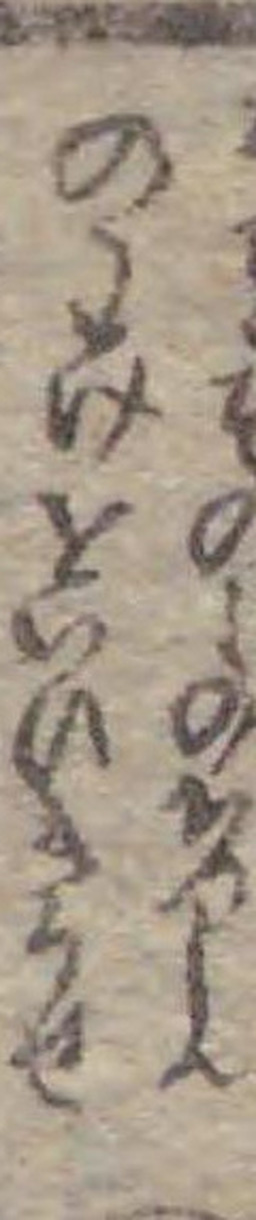のわけをいひきかせ
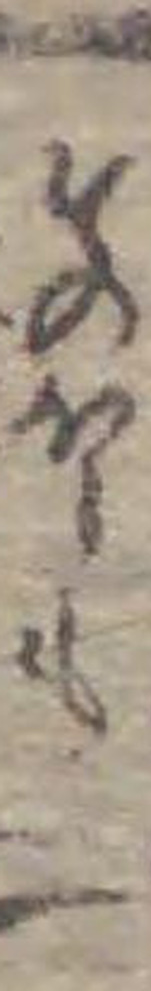そのほうも
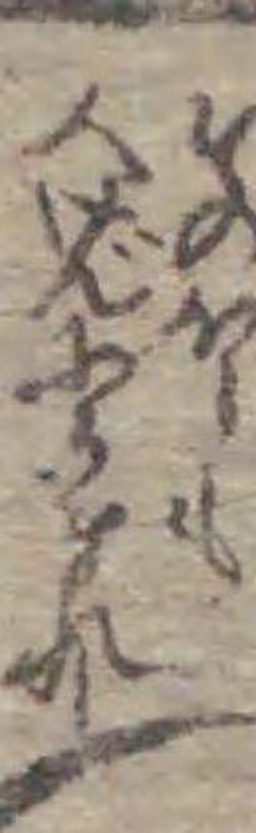人げんにうまれし
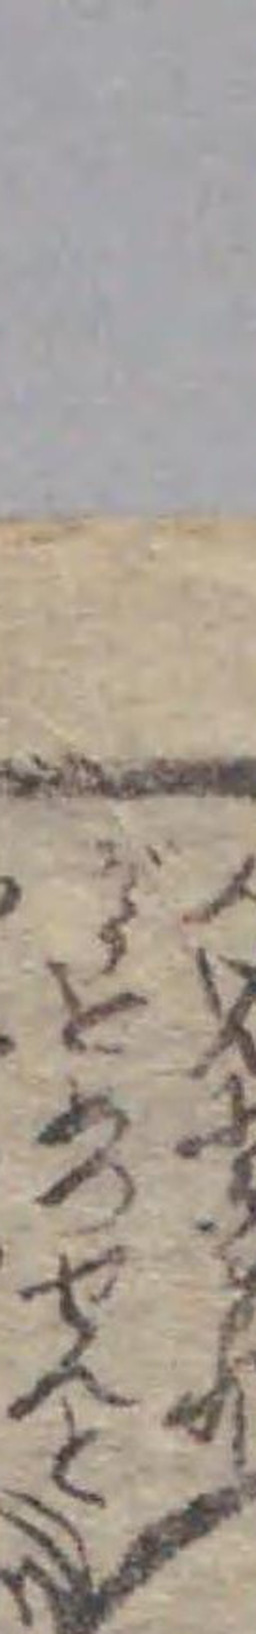がうをめつせんと
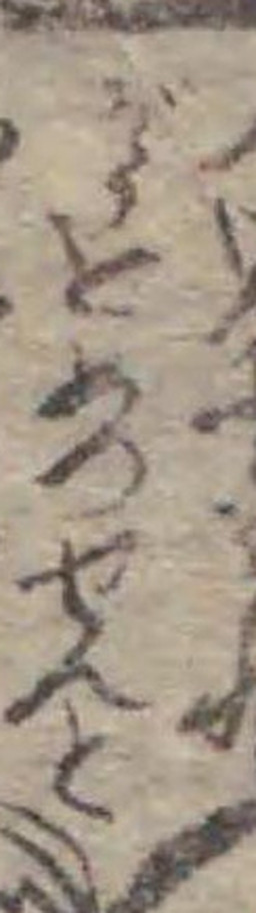がうをめつせんと
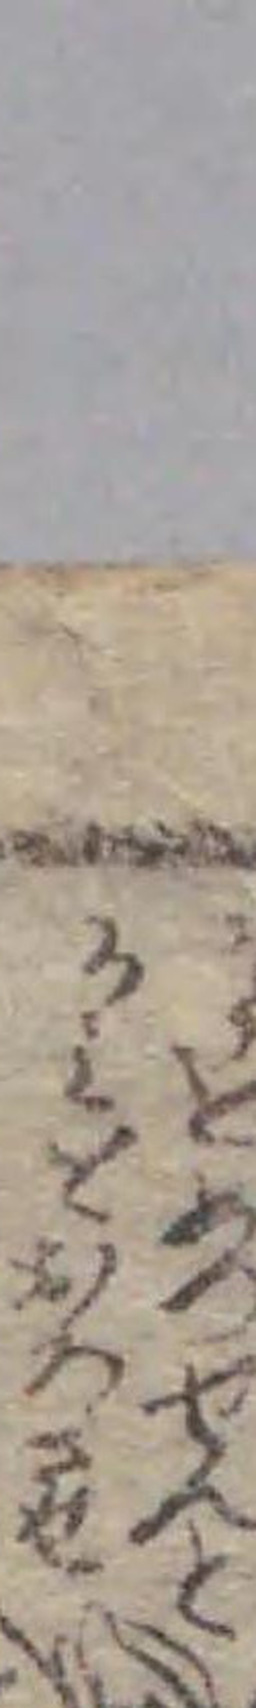かみをおろさせ
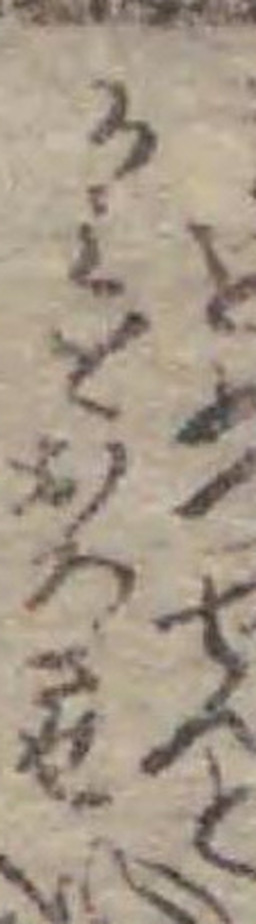かみをおろさせ
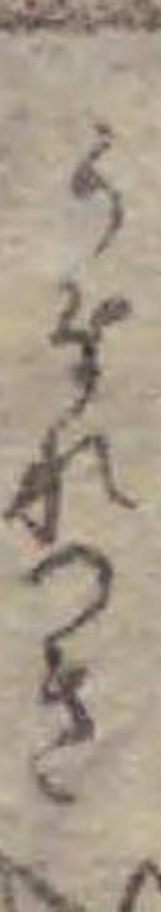うまれつき
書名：[化物一代記] : 5巻
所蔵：国立国会図書館 National Diet Library, JAPAN
